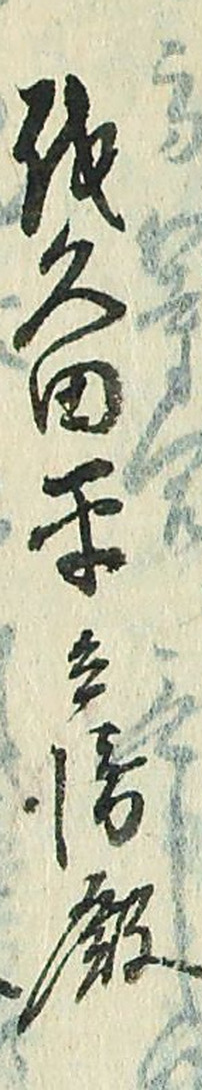越久田平兵衛殿
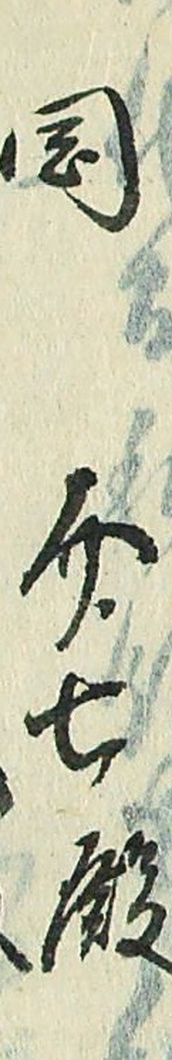岡介七殿
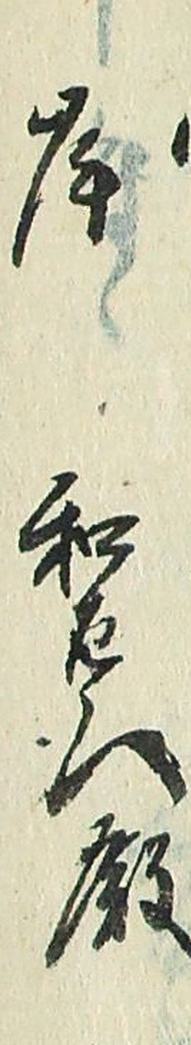岸和左衛門殿

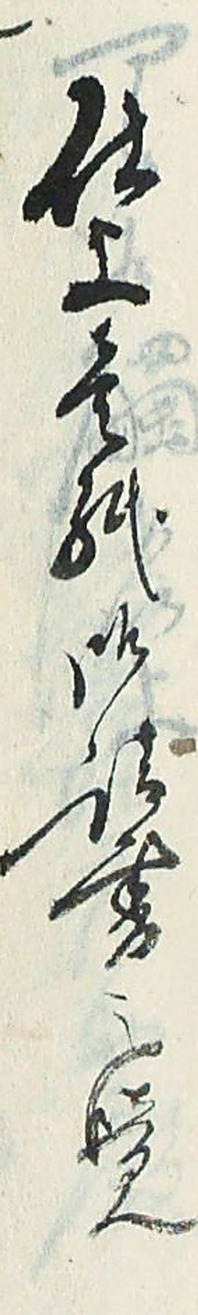仕上壱紙御請書之覚
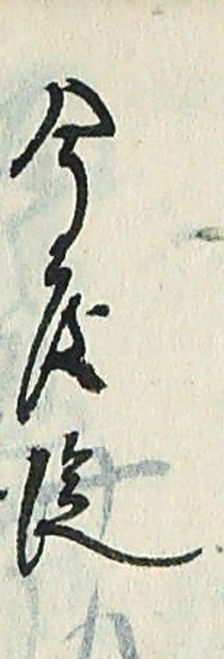今度従
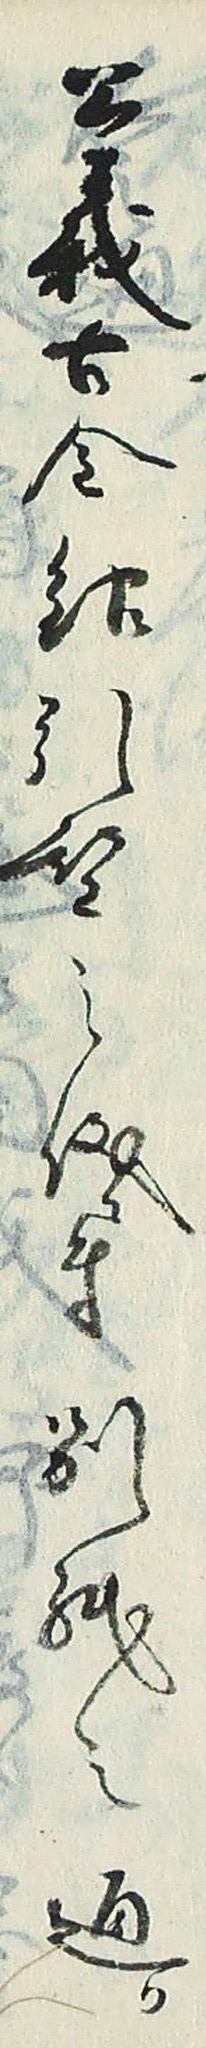公義古金銀引替之儀に付別紙之通り
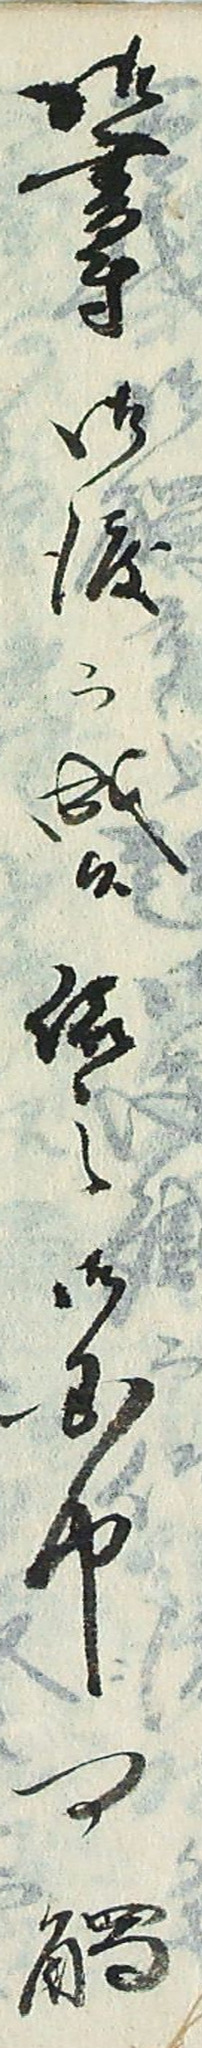御書付御渡被成候依之御国中可触
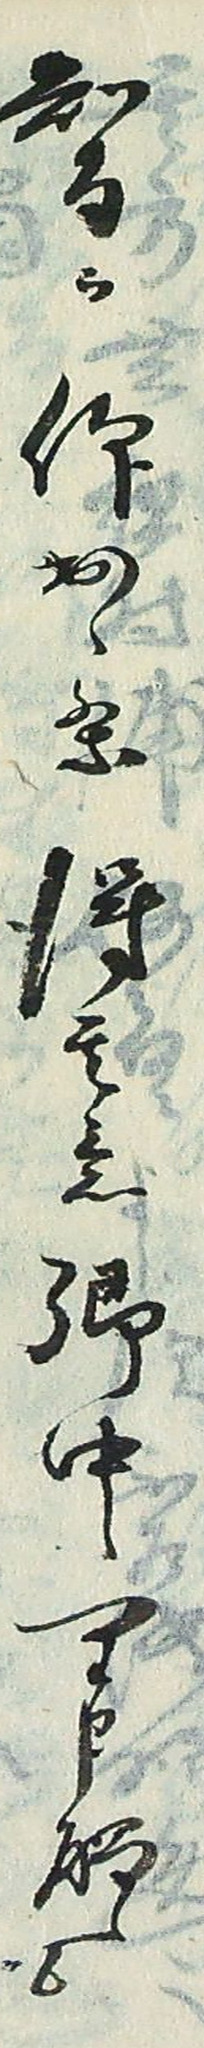知旨被仰出候条得其意郷中可被申触候以上
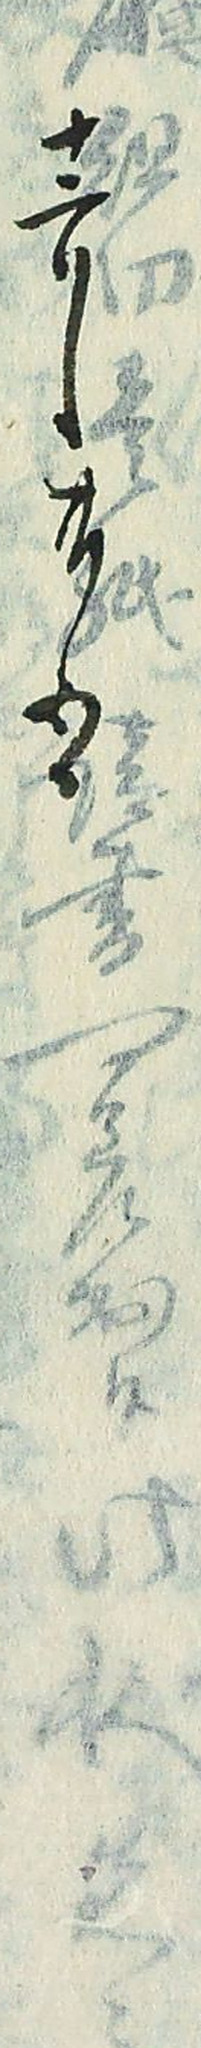十二月廿五日
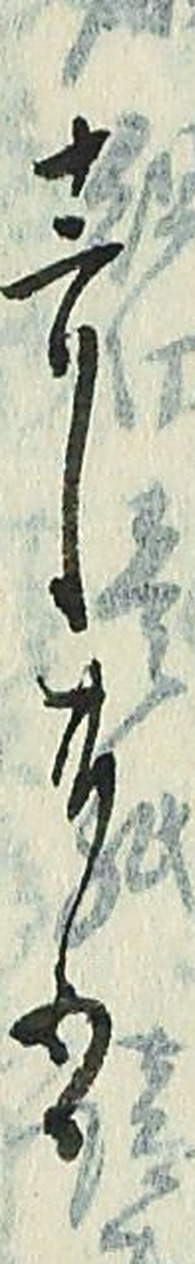十二月廿五日
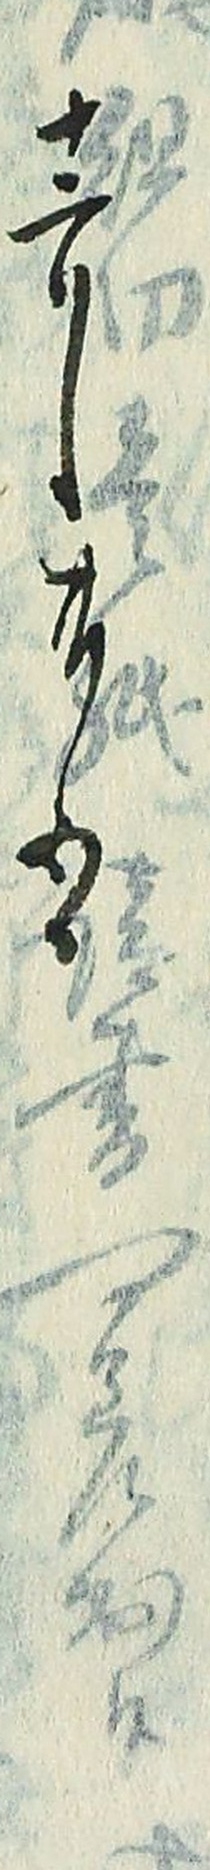十二月廿五日
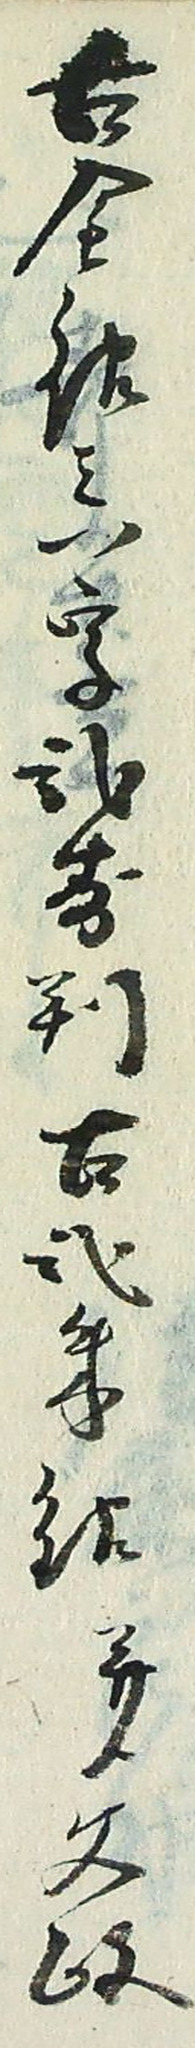古金銀真字弐歩判古弐朱銀幷文政
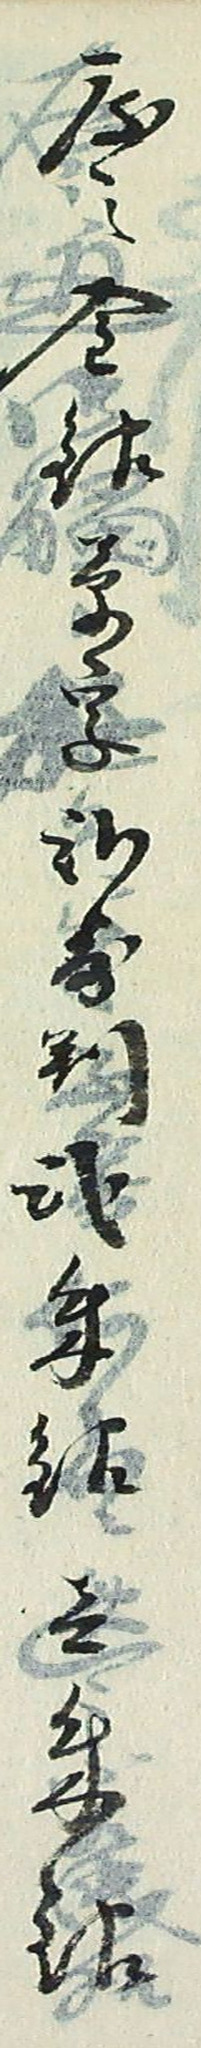度之金銀草字弐歩判弐朱銀壱朱銀
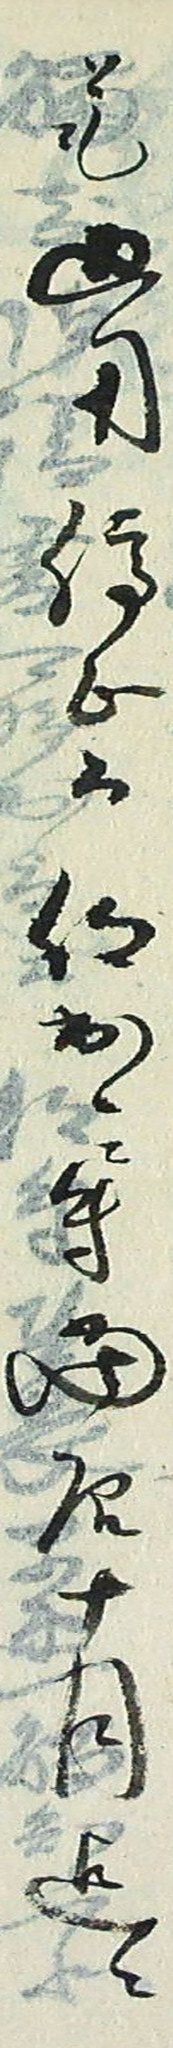とも通用停止被仰出候に付当辰十月迄に
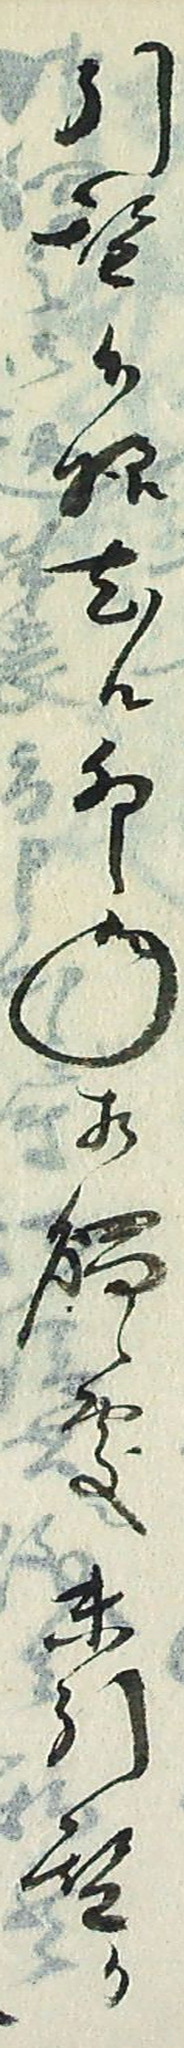引替候様去る卯年相触候処未引替り
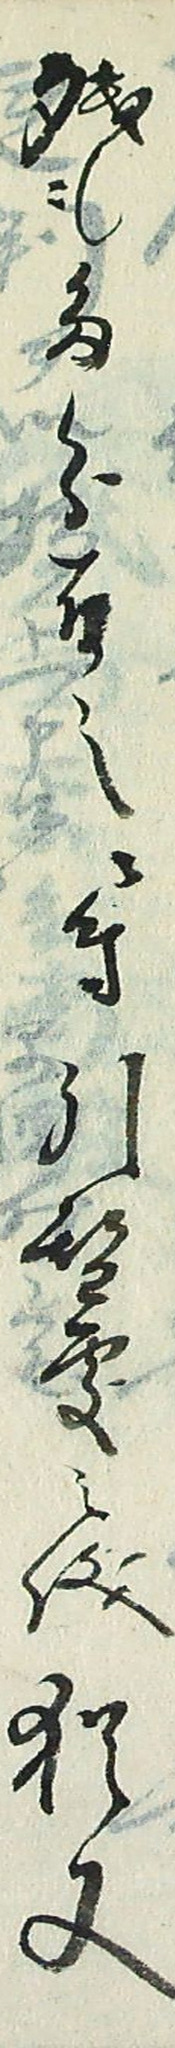残も多分有之に付き引替処之儀猶又
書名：諸御用御□受書控
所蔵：鳴門教育大学 Naruto University of Education
